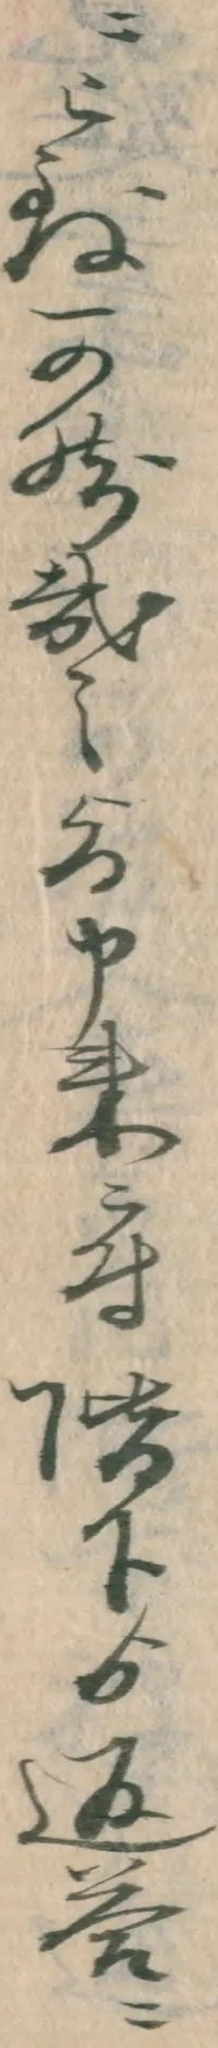ニ被致可然哉之旨申来ニ付階下ゟ返答ニ
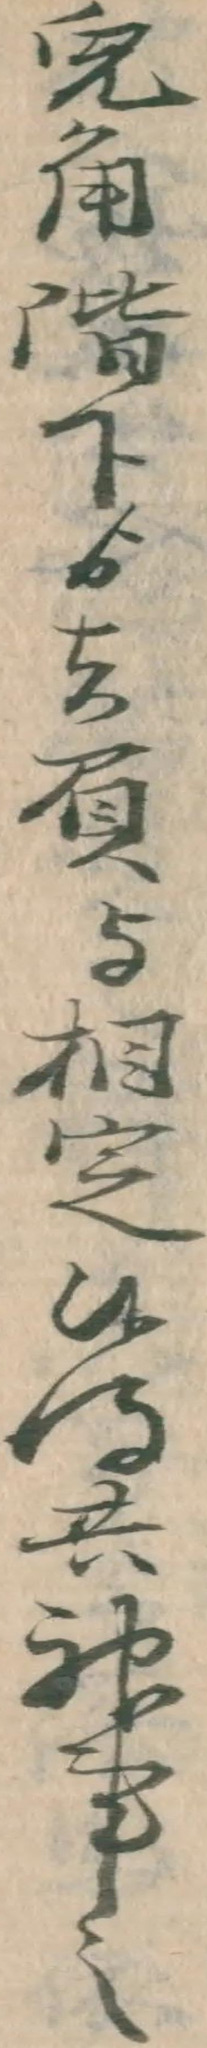兎角階下ゟ者負与相定候得共神事之
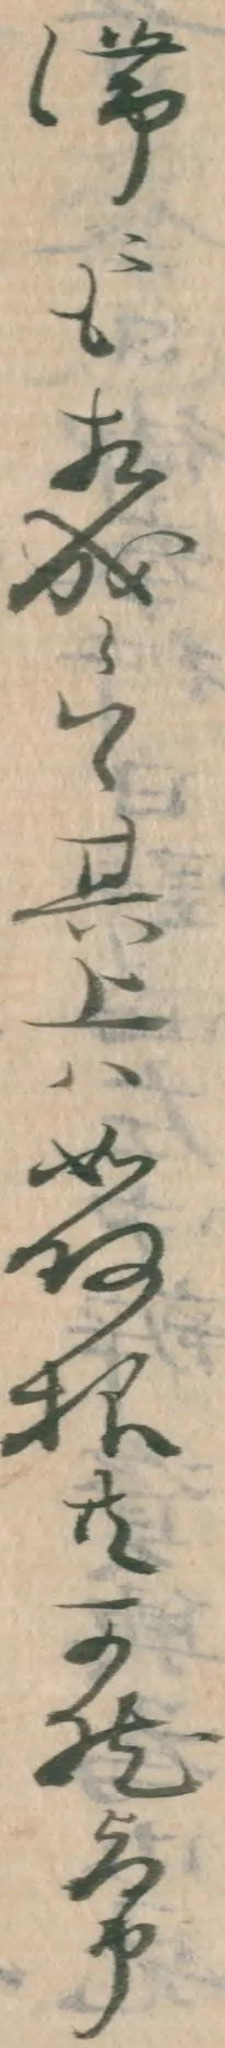滞ニも相成候ハゝ其上ハ如何様共可然旨申
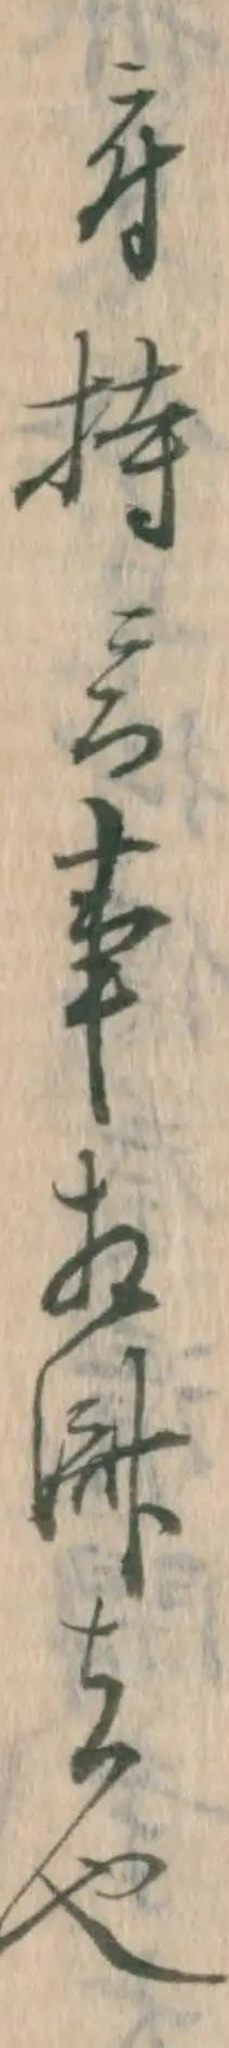ニ付持ニ而事相済者也
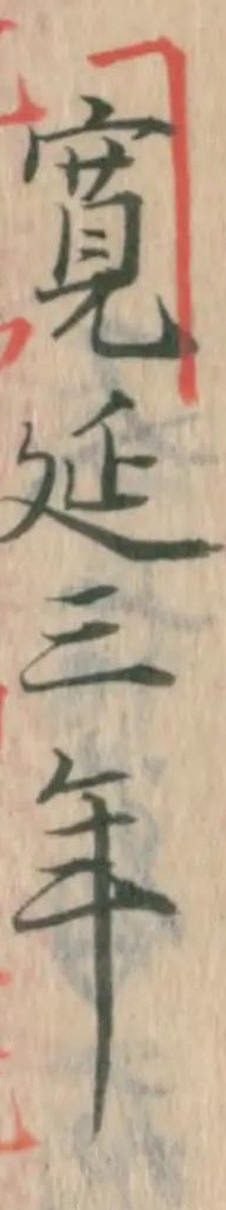寛延三年
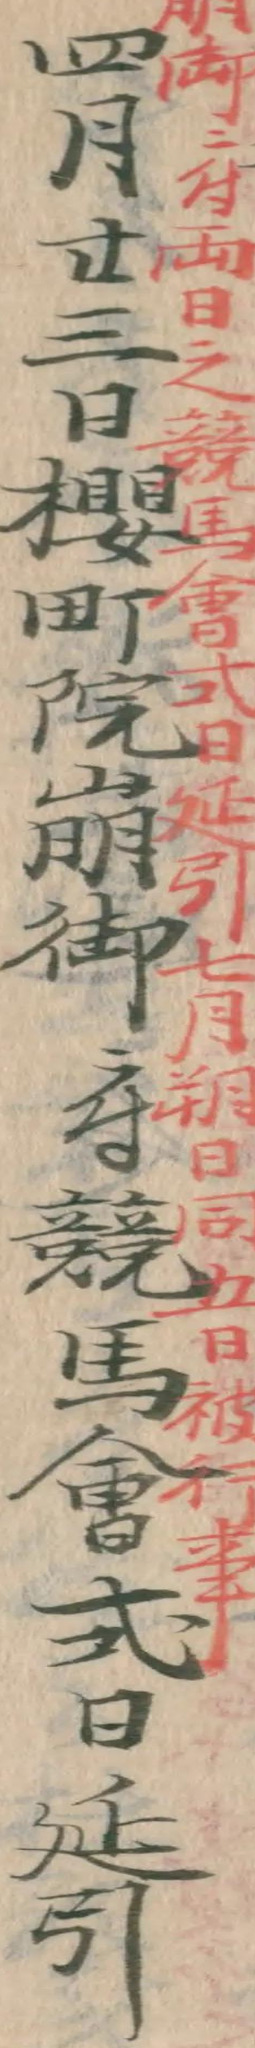四月廿三日桜町院崩御ニ付競馬会式日延引
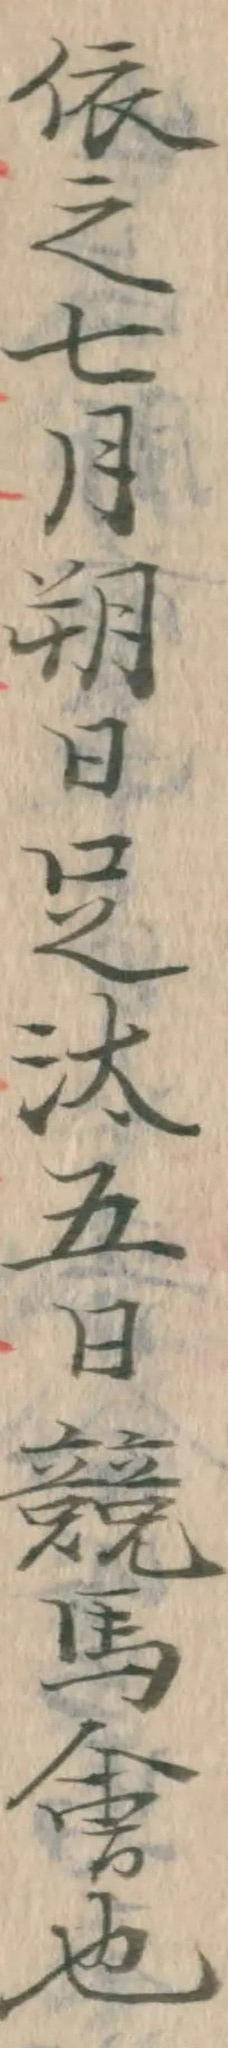依之七月朔日足汰五日競馬会也
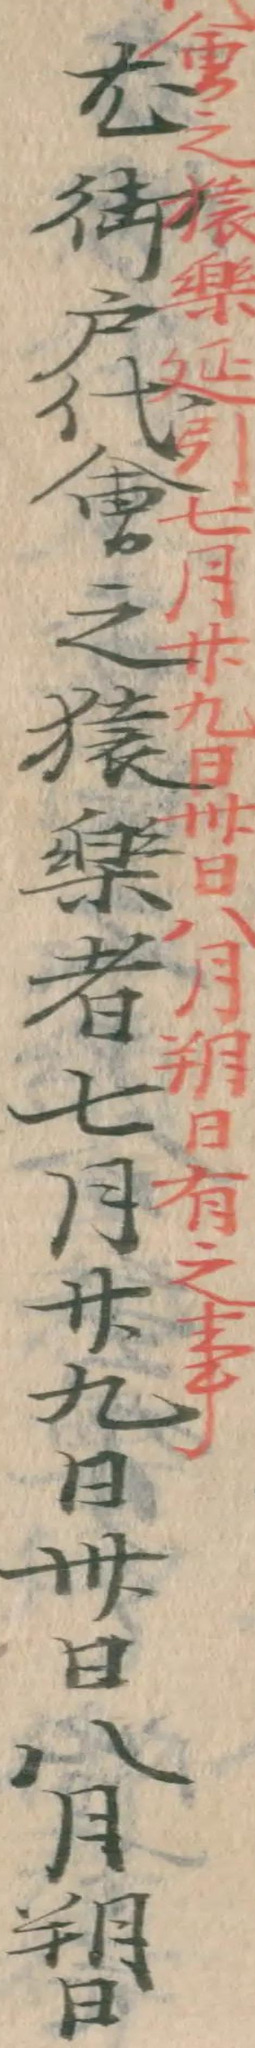尤御戸代会之猿楽者七月廿九日卅日八月朔日
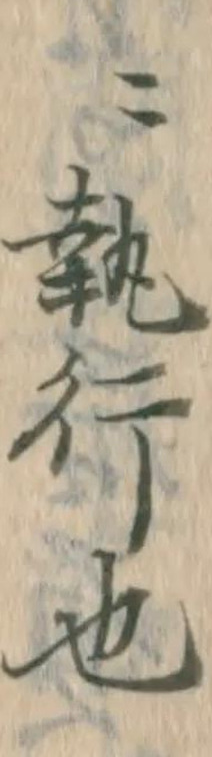ニ執行也
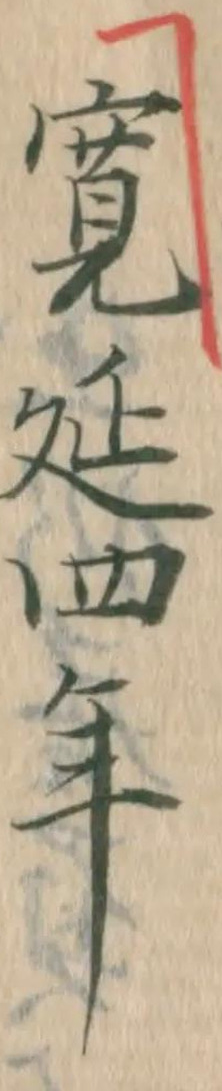寛延四年
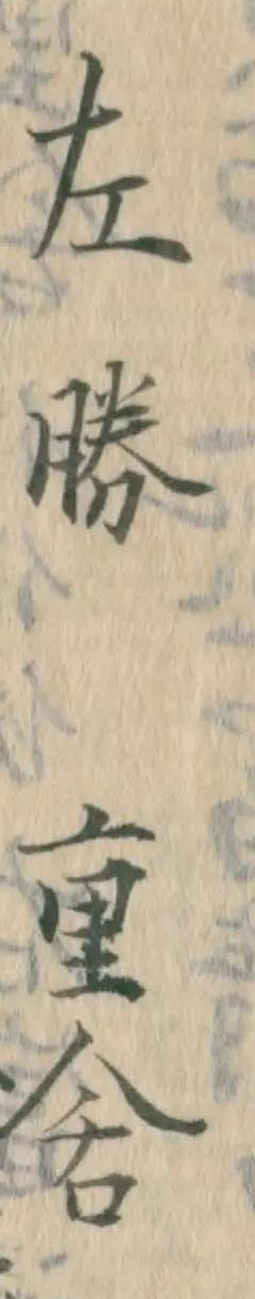左勝重舎
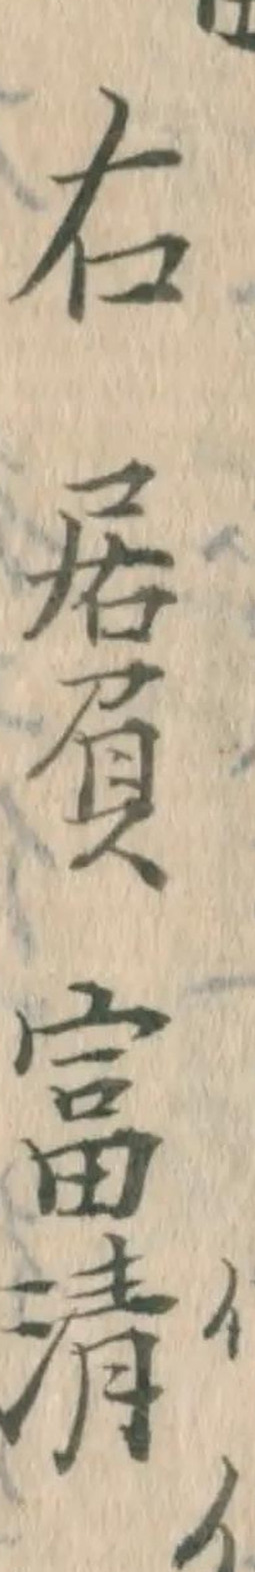右居負富清

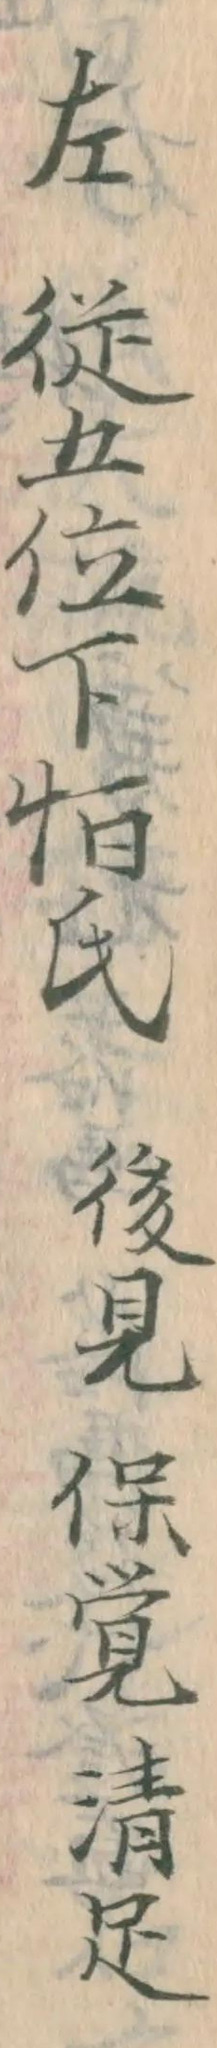左従五位下恒氏後見保覚清足
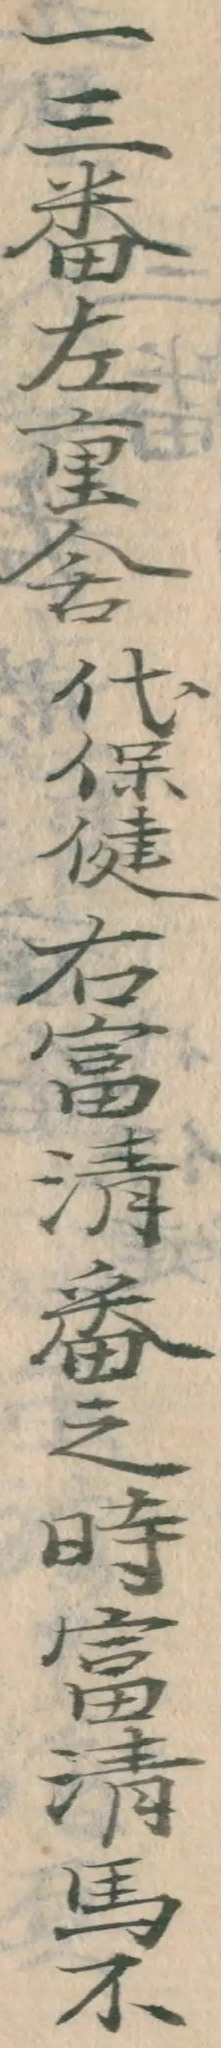一三番左重舎代保健右富清番之時富清馬不
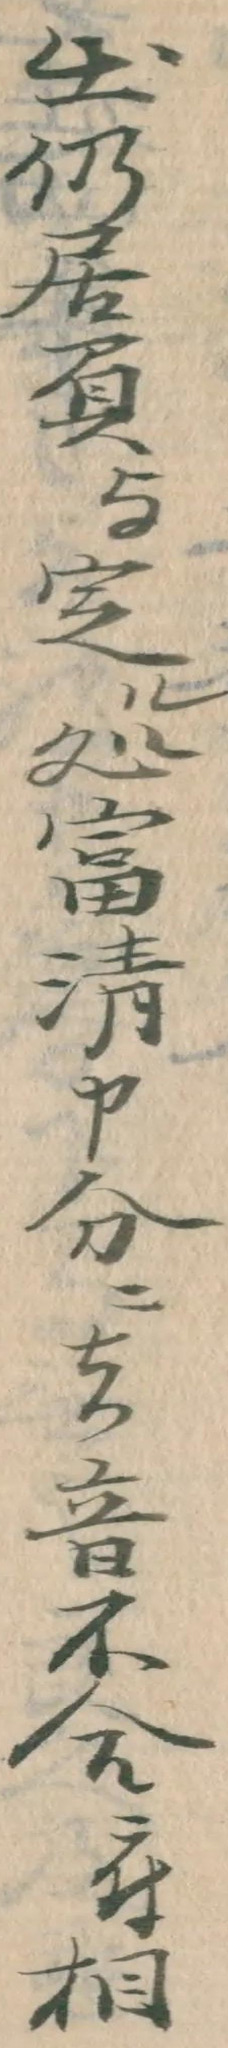出仍居負与定ル処富清申分ニ者音不合ニ付相
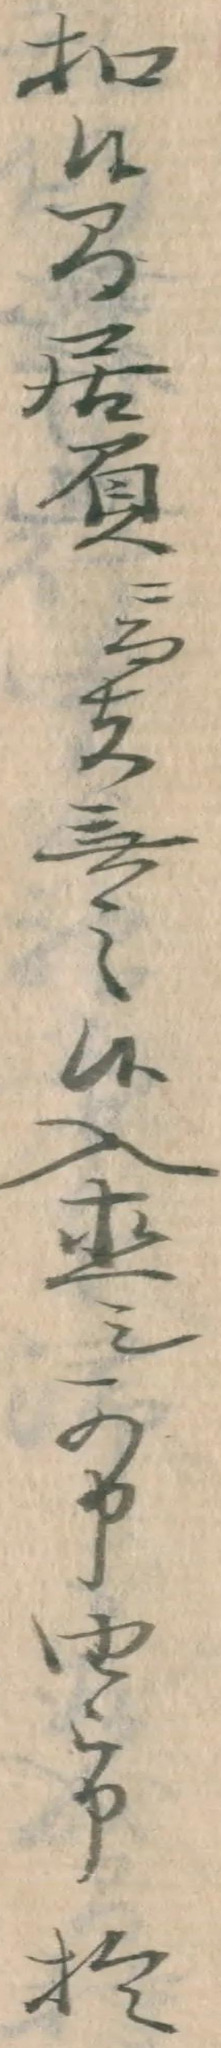扣候間居負ニ而者無之候入直シ可申由被申於
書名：賀茂社記録. 第10冊
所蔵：国立国会図書館 National Diet Library, JAPAN
